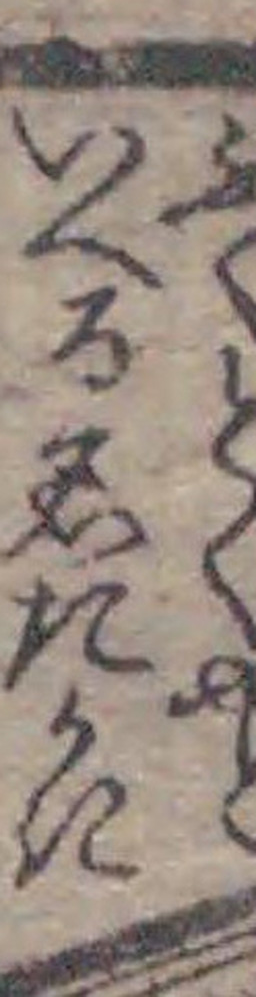いへる名たかき
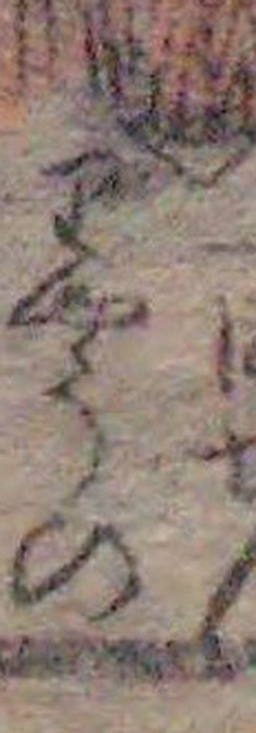りやうの
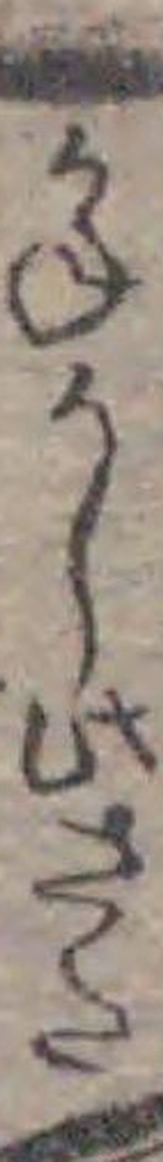かねかし此さた
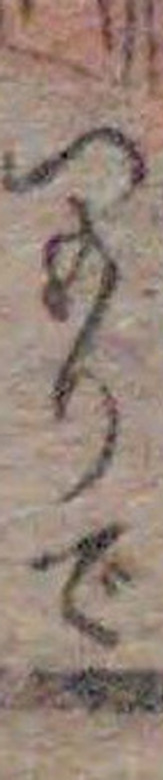つもりで
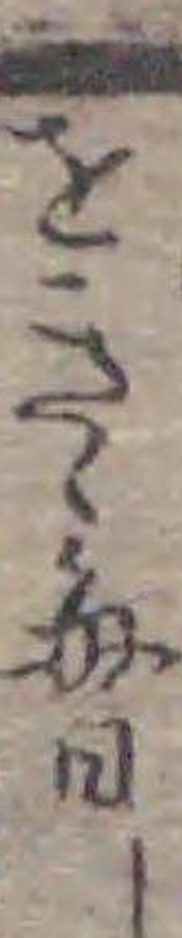をきゝ毎日
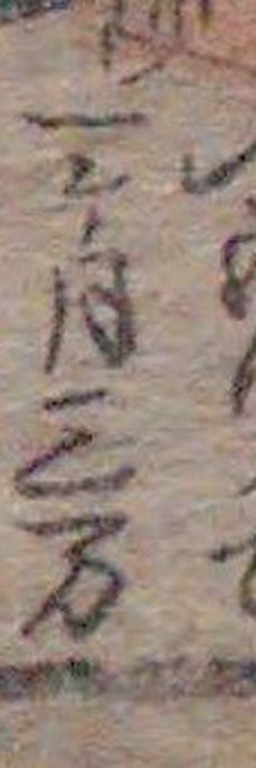一ヶ月三万
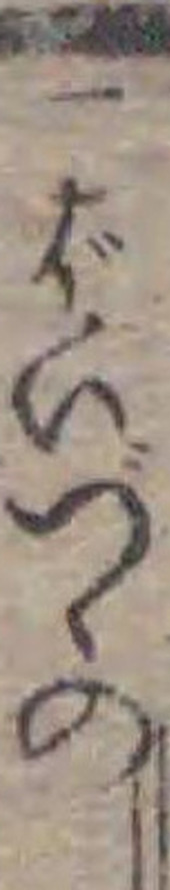一ばいづゝの
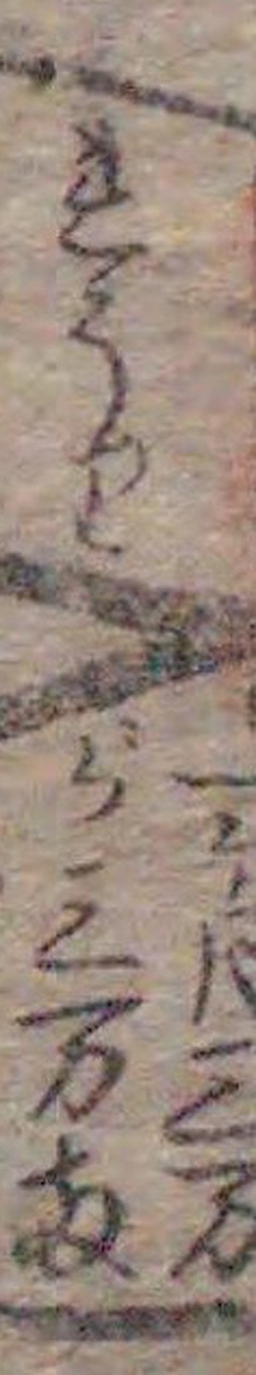れうりが三万両
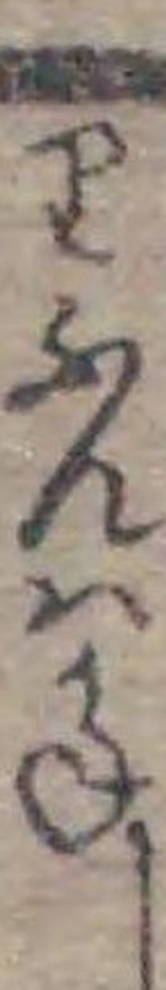りふんはかね
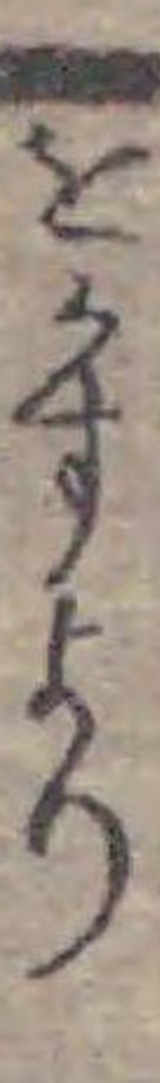をかすより
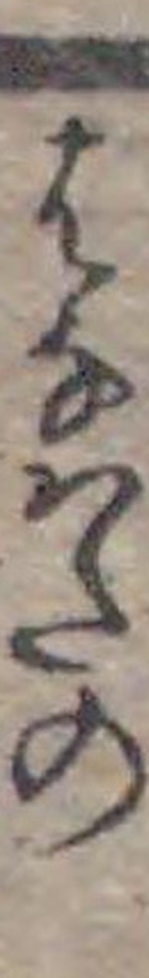はなはたの
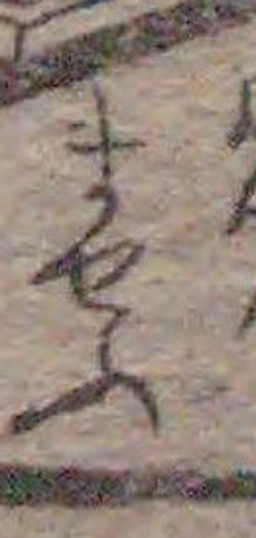ませふ
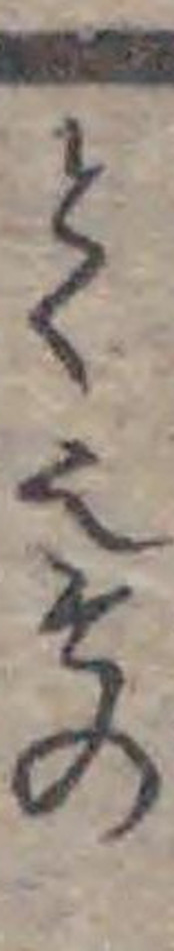とく也その
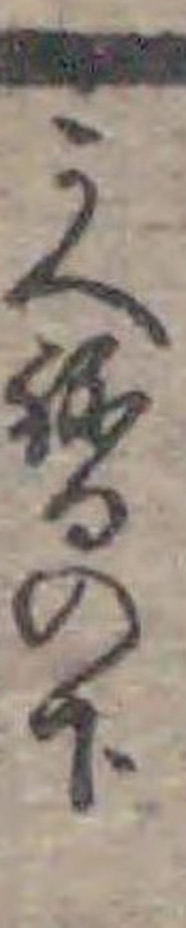うへねるの下
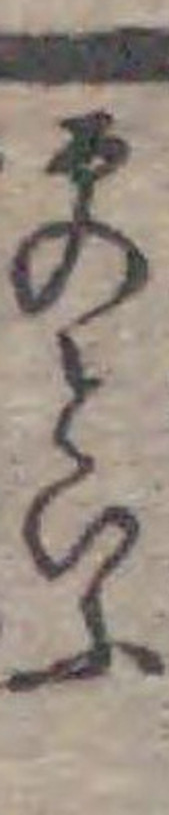るのといふ
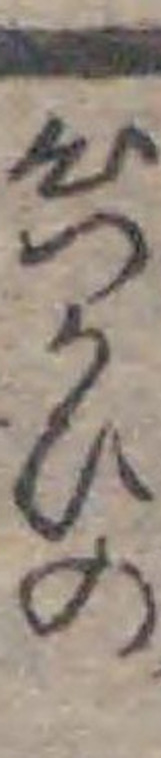心つかひの
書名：紺屋百物語 : 3巻
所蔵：国立国会図書館 National Diet Library, JAPAN
